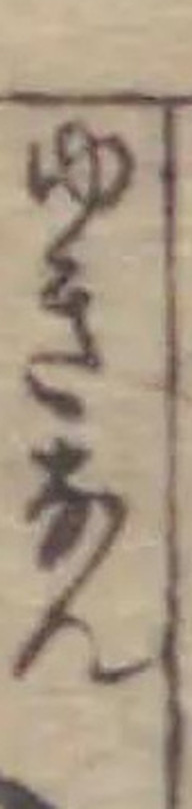ゆきなん
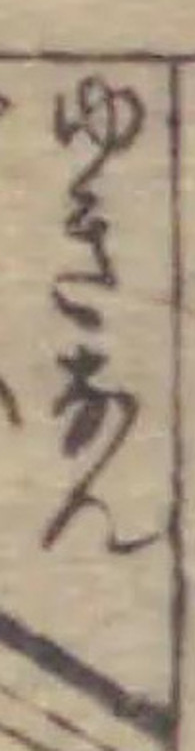ゆきなん
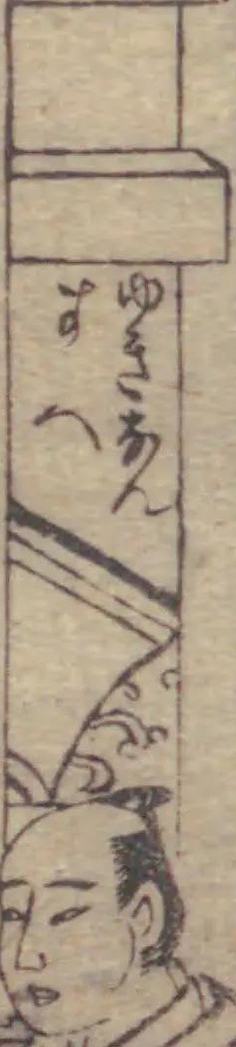ゆきなん
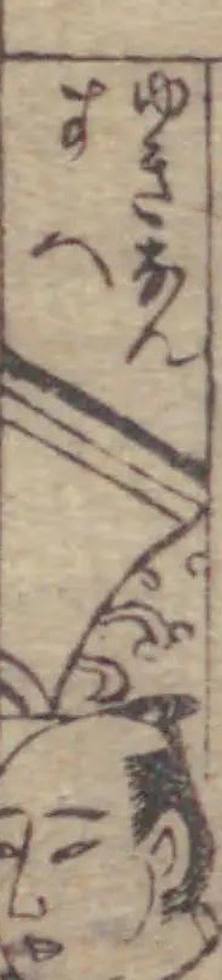ゆきなん
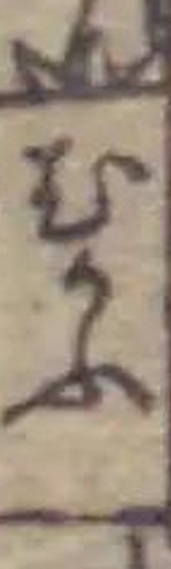むかう

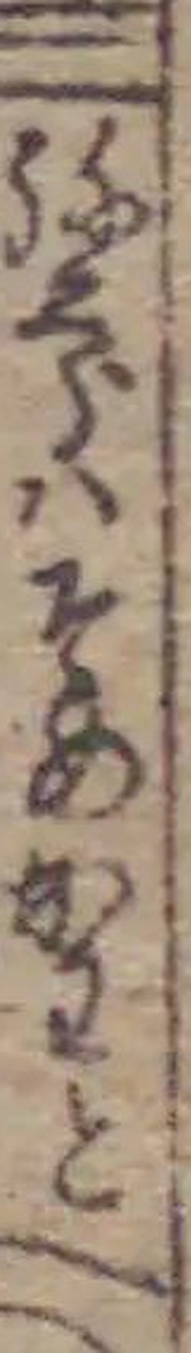弥二郎はそめかわと
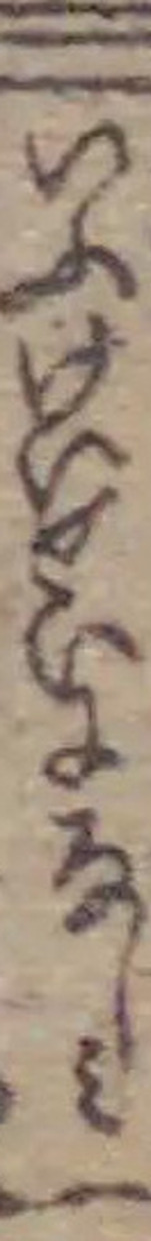いふけいせいになしみ
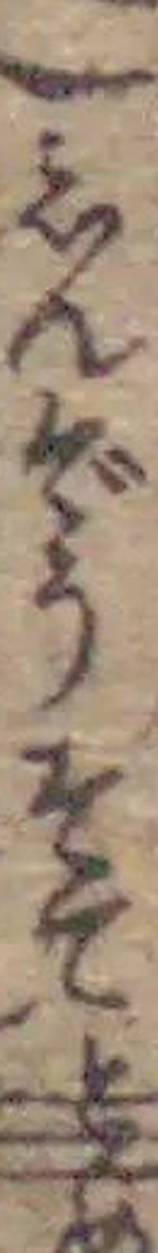しんぞうそてとめ
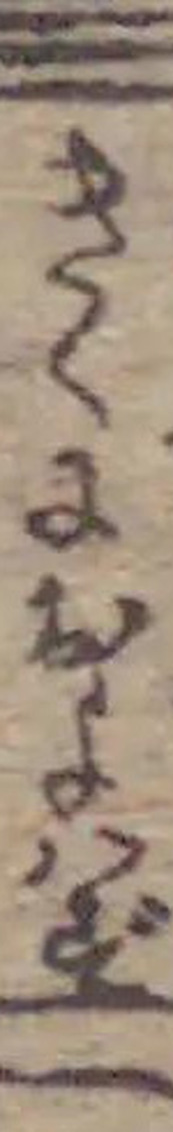きくにおよはず
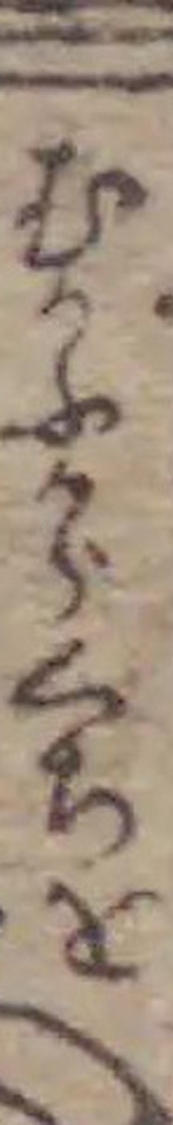むかふからくちを
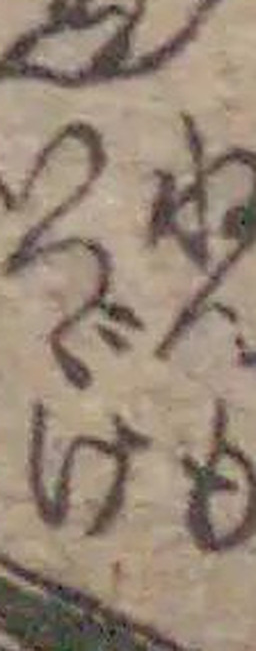いつゞけ
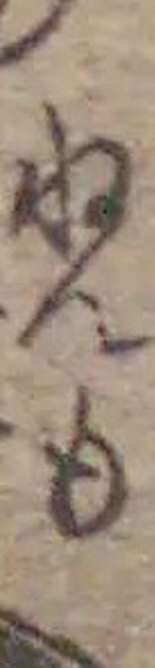ねんも
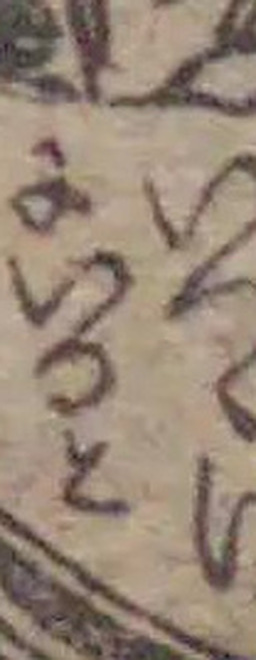にいると
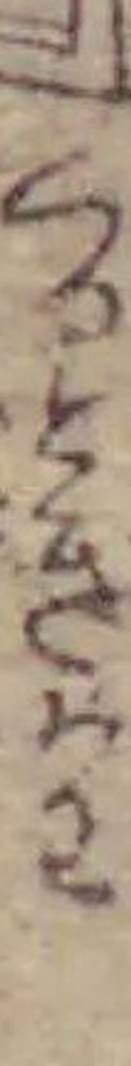くるときかわ
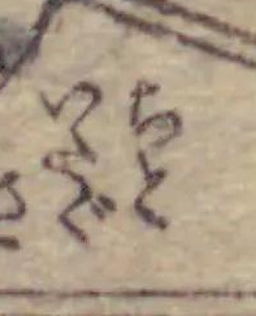いたゞ
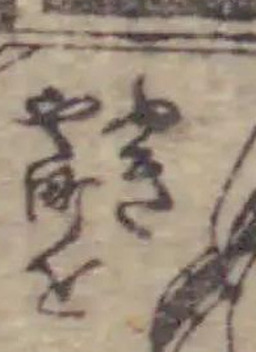や町を
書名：虚言弥二郎傾城誠 3巻
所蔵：国立国会図書館 National Diet Library, JAPAN
